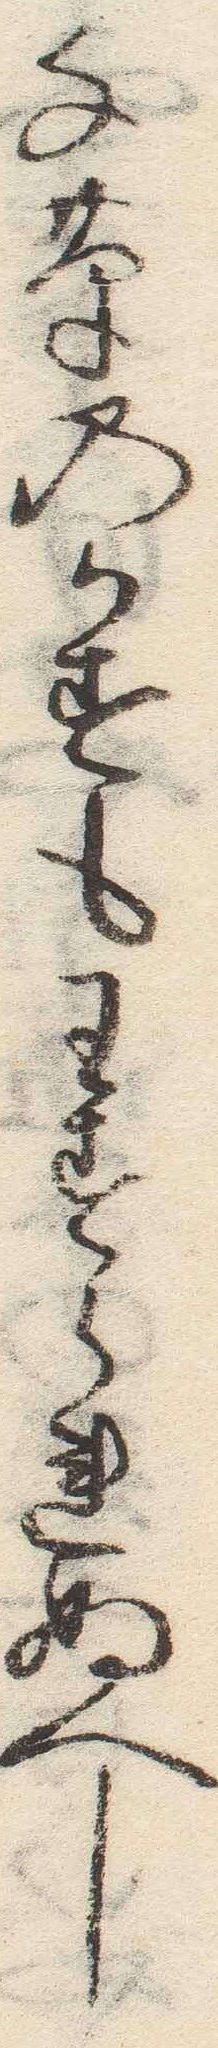千草のかすもわすられぬへし
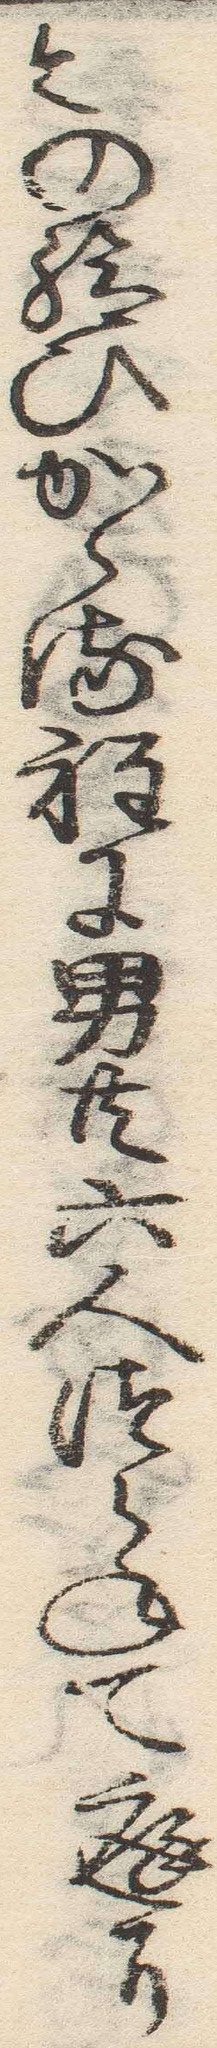との給ひかゝる程に男共六人つらねて庭に
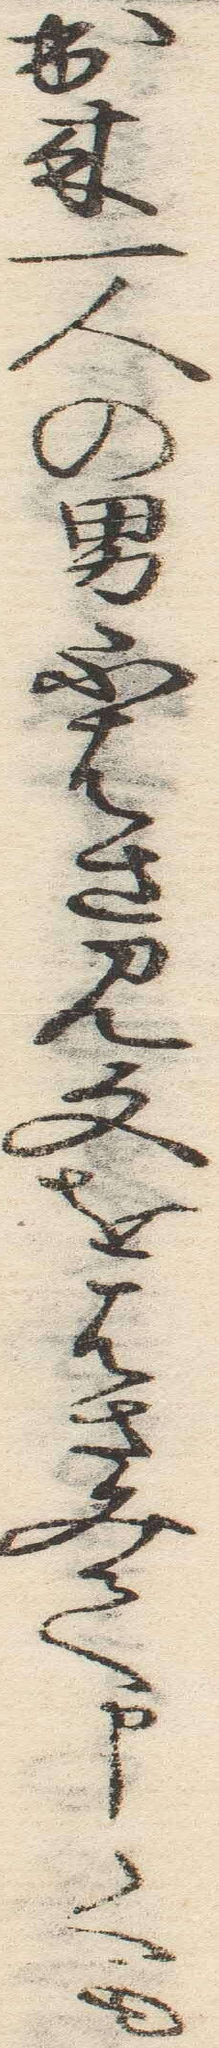出来一人の男ふはさみ文をはさみて申くも
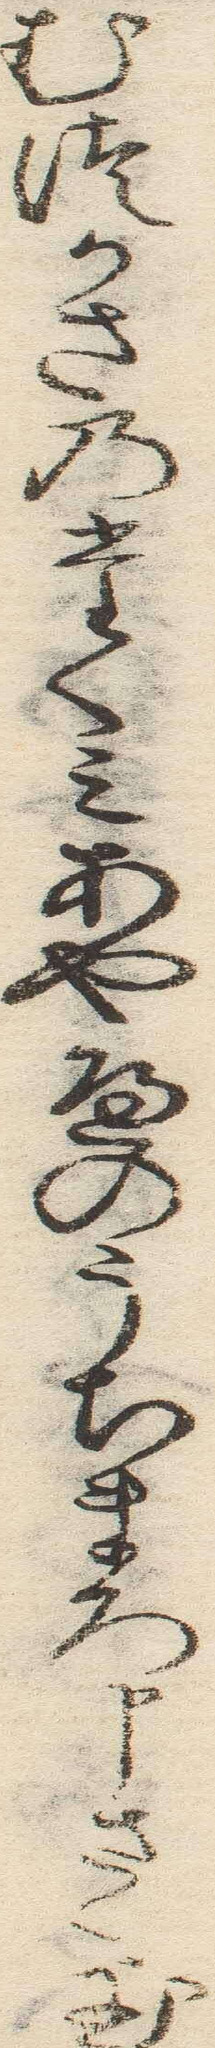むつかさのたくにあやへのうちまろ申さく玉
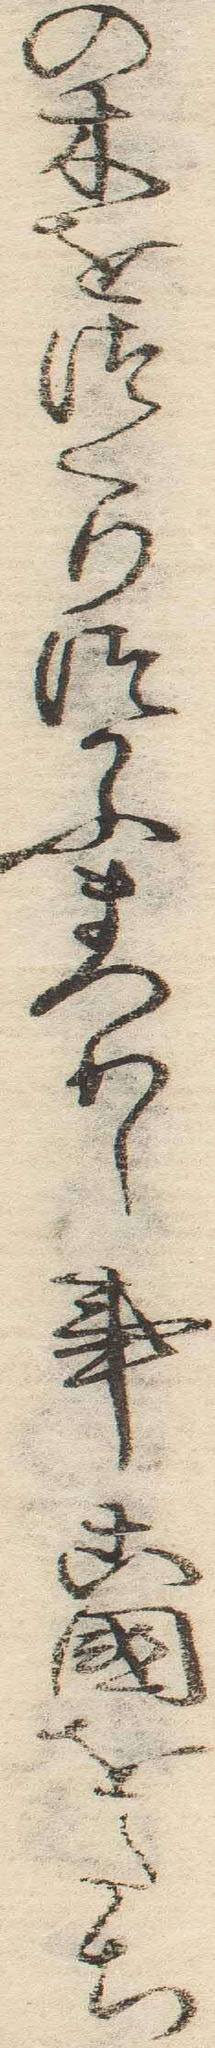の木をつくりつかふまつりし事こ国をたち
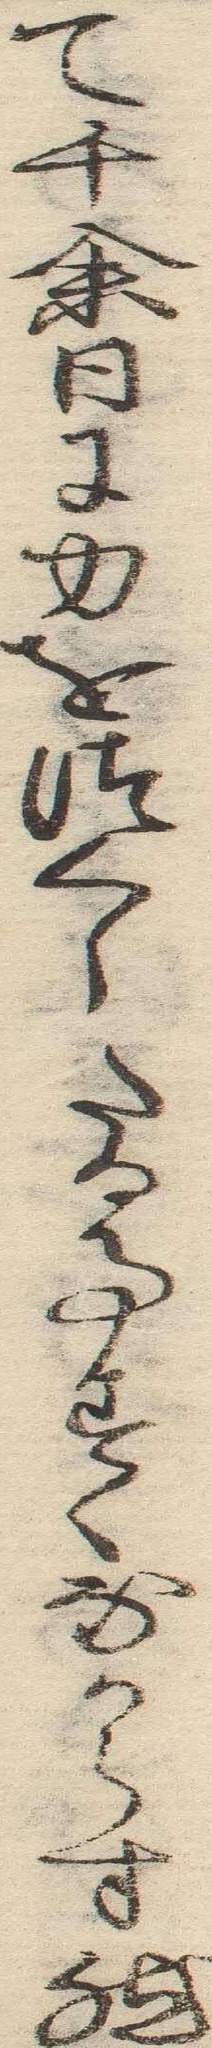て千余日に力をつくしたる事すくなからす然

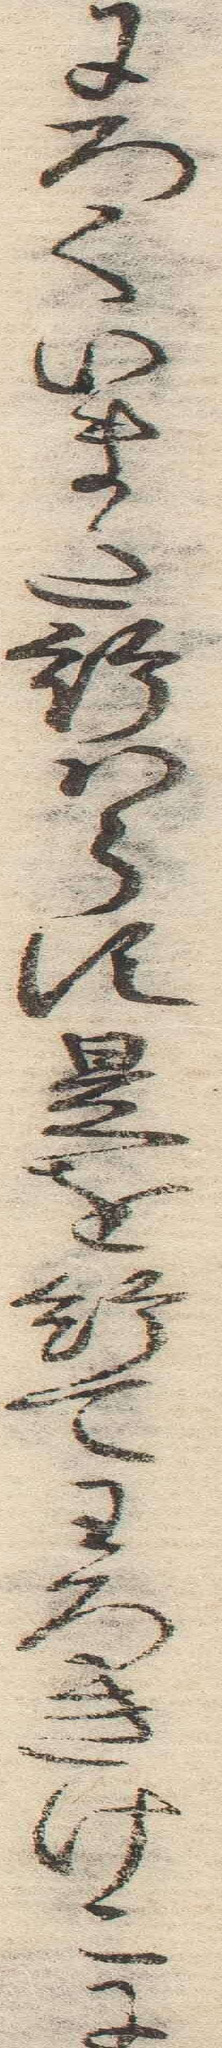にろくいまた給はらす是を給てわろきけこに
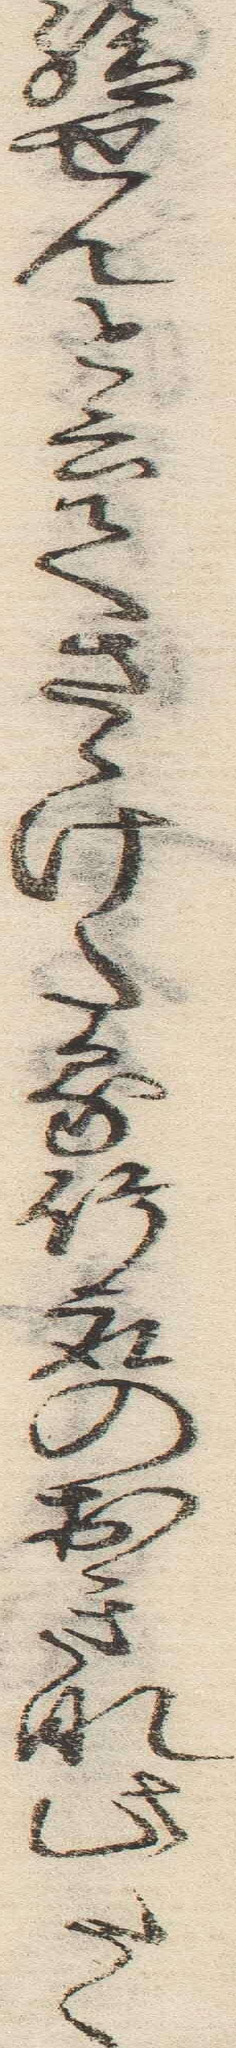給せんと云てさゝけたる竹取のおきな此たく
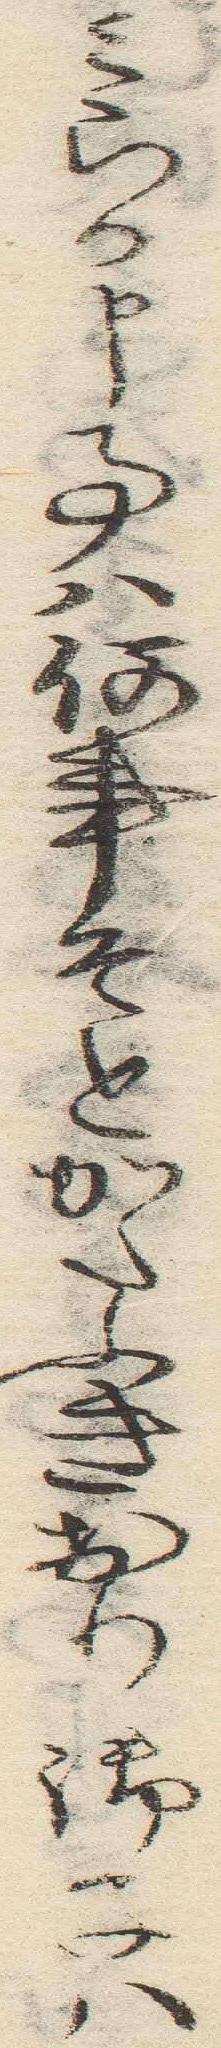みらか申事は何事そとかたふきおり御子は
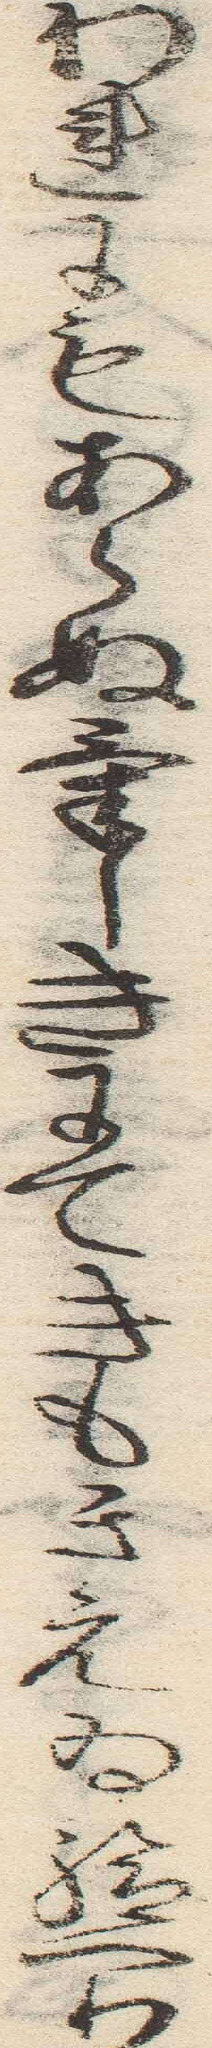われにもあらぬけしきにてきもきえゐ給へり
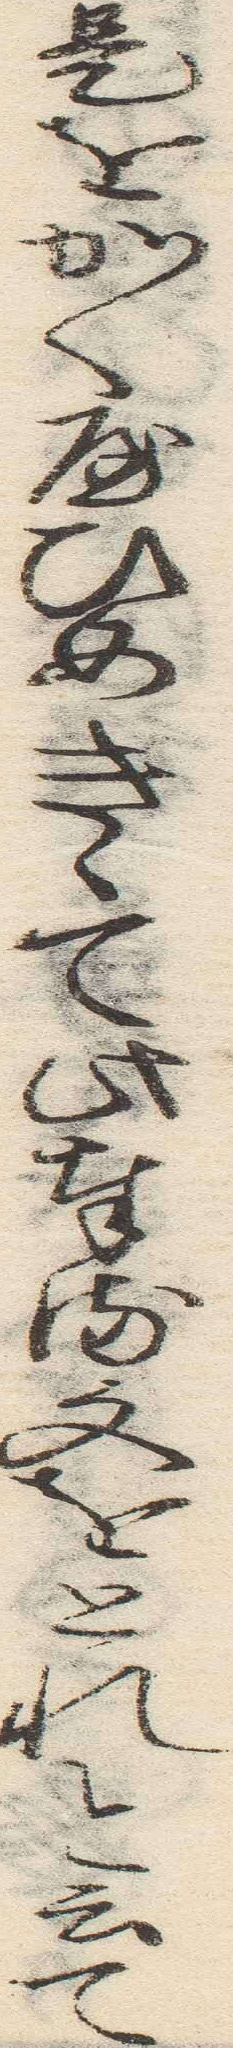是をかくやひめきゝて此奉る文をとれと云て
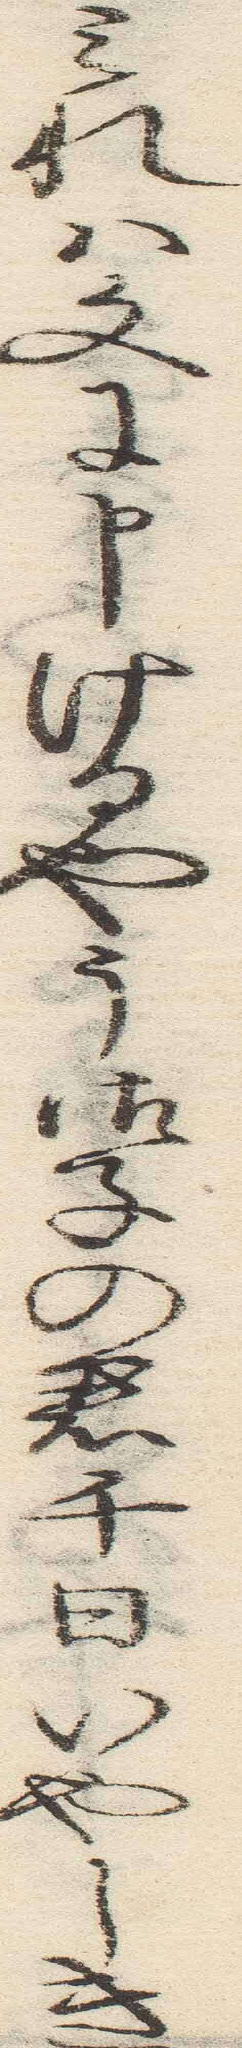みれは文に申けるやう御子の君千日いやしき
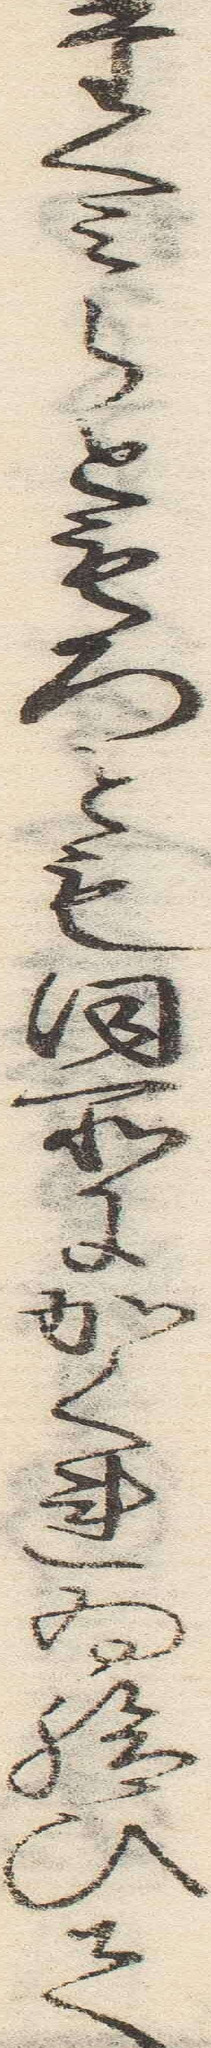たくみらともろとも同所にかくれゐ給ひて
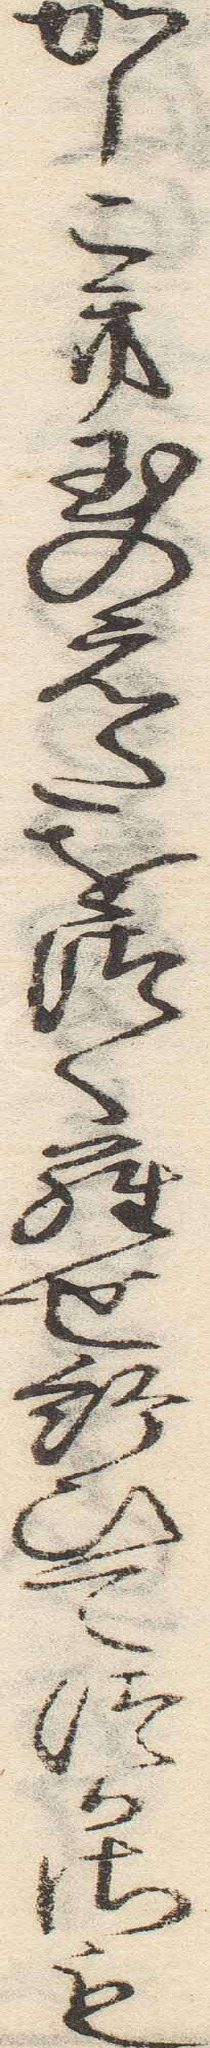かしこき玉のえたをつくらせ給ひてつかさも
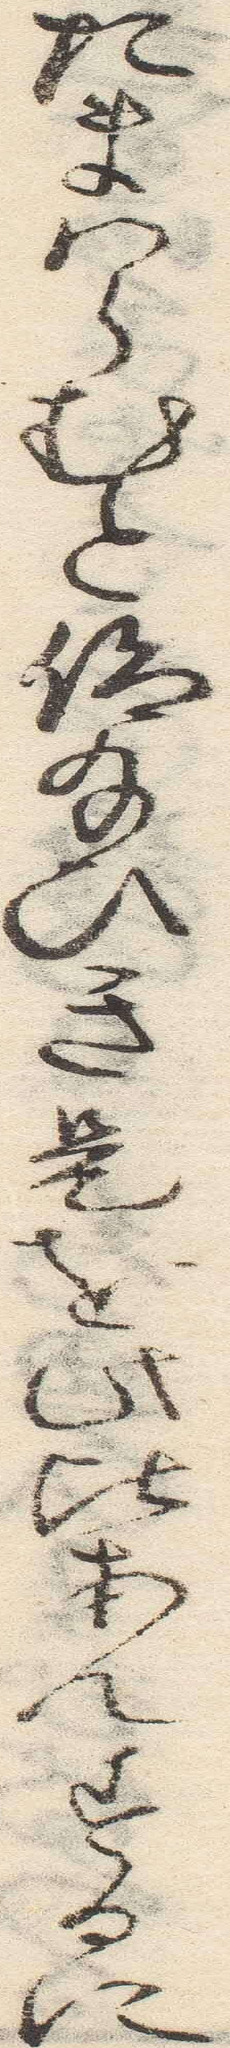たまはらむと仰給ひき是を此頃あんするに
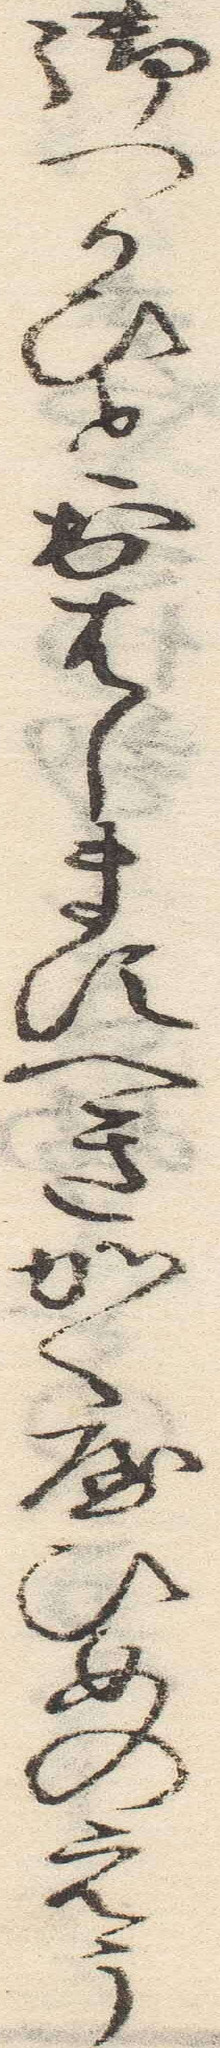御つかひとおはしますへきかくやひめのえう
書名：竹取物語
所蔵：東京学芸大学附属図書館 国文学研究資料館
